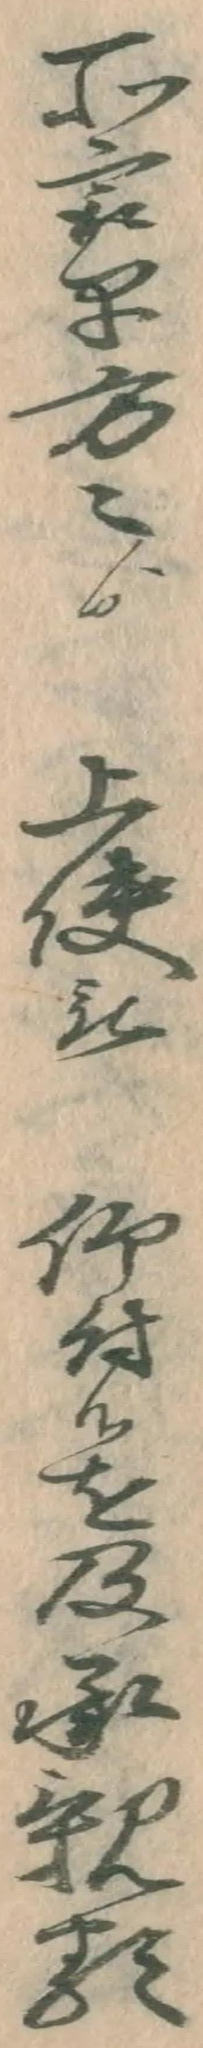所最早方々ゟ上使被仰付候を及承親類

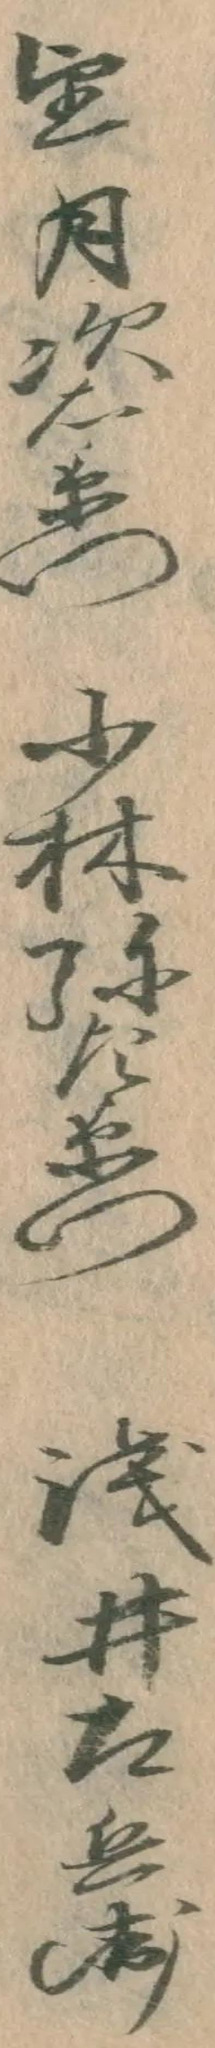望月次右衛門小林弥左衛門浅井太兵衛
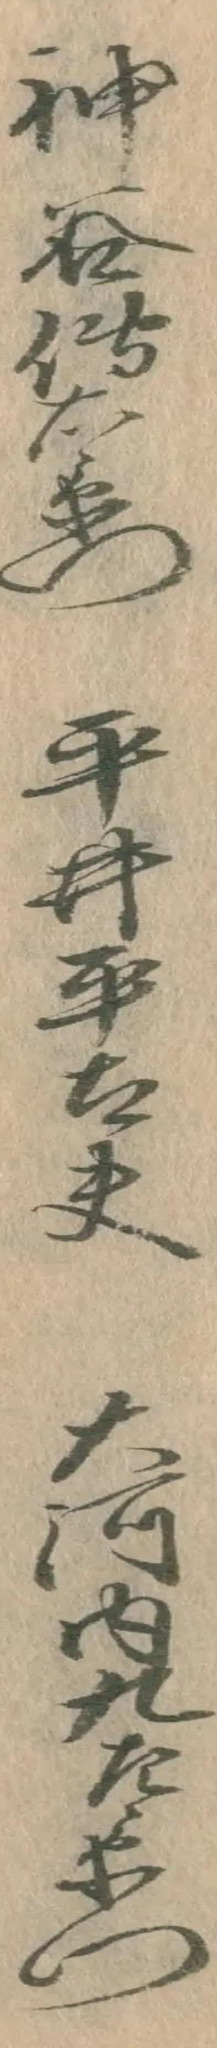神谷伝右衛門平井兵太夫大河内九左衛門
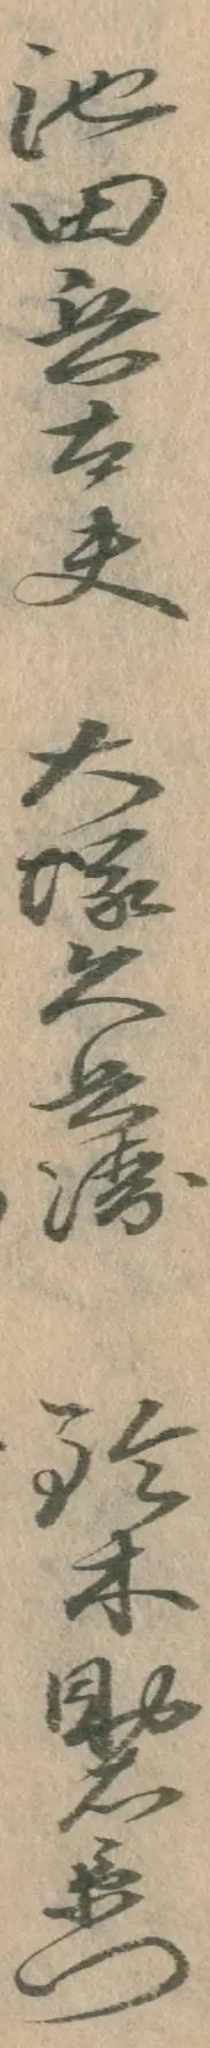池田兵太夫大塚久兵衛鈴木助右衛門
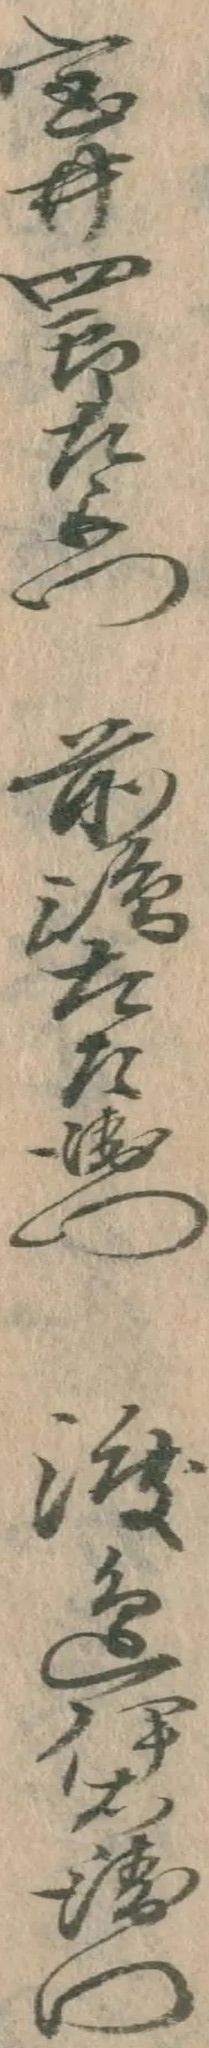室井四郎左衛門前島太左衛門渡辺居伊右衛門
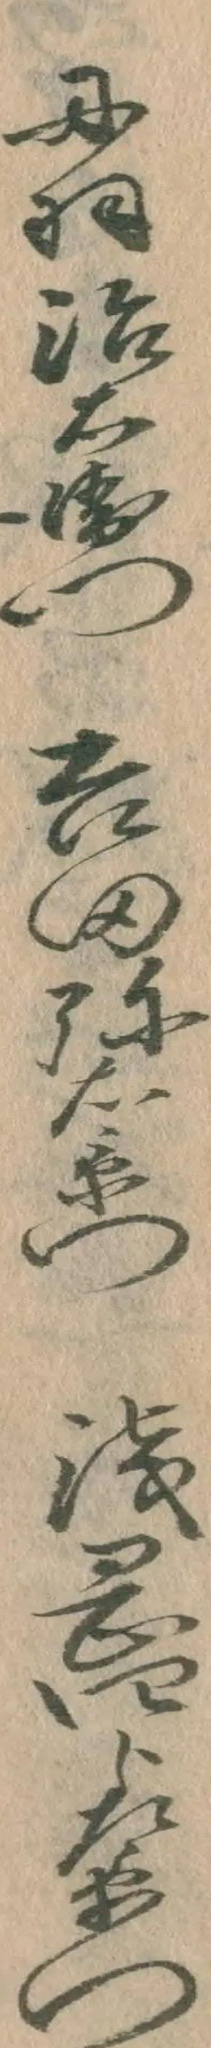丹羽治右衛門吉田弥右衛門浅岡四郎左衛門
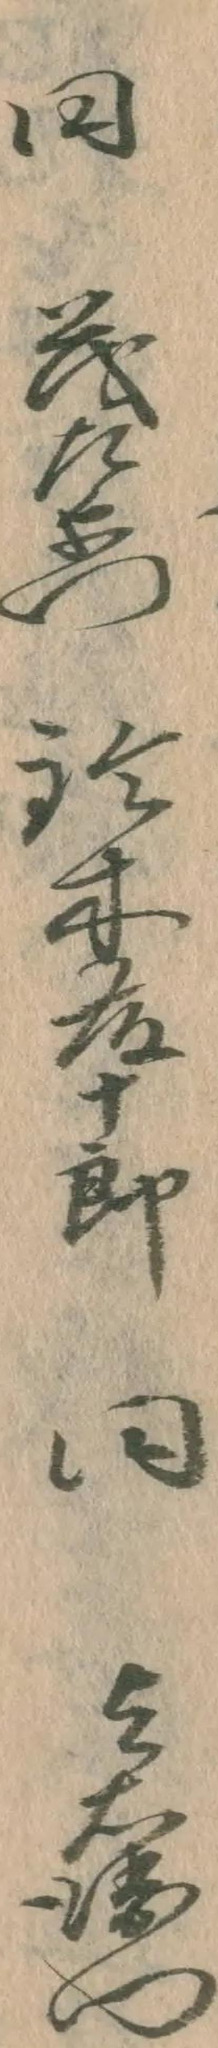同茂左衛門鈴木藤十郎同与右衛門
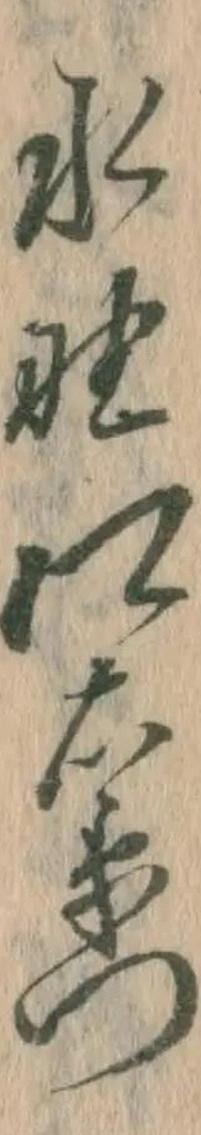水野郷右衛門
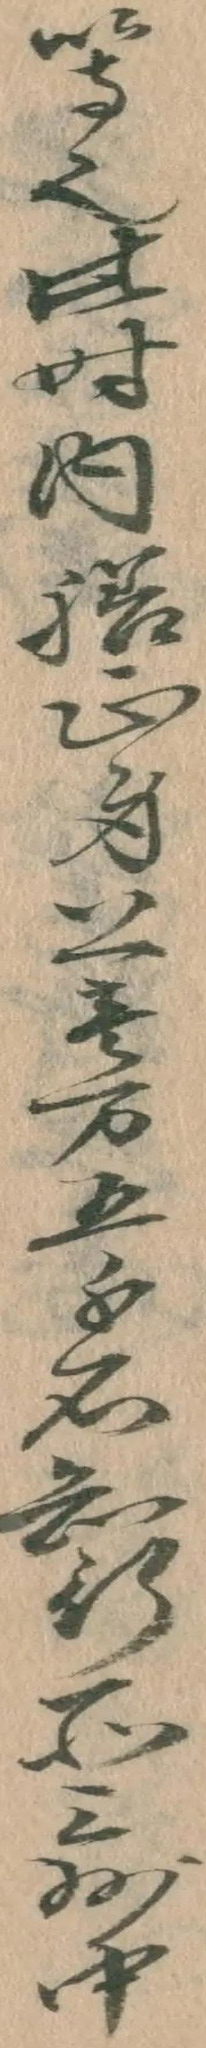等也此時内膳正身上壱万五千石知行所三州中
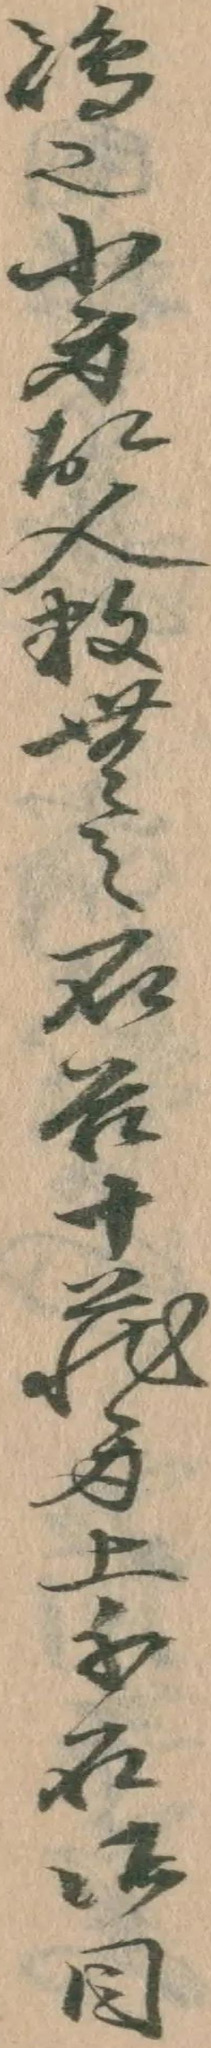島也小身故人数無之石谷十蔵身上千石御目
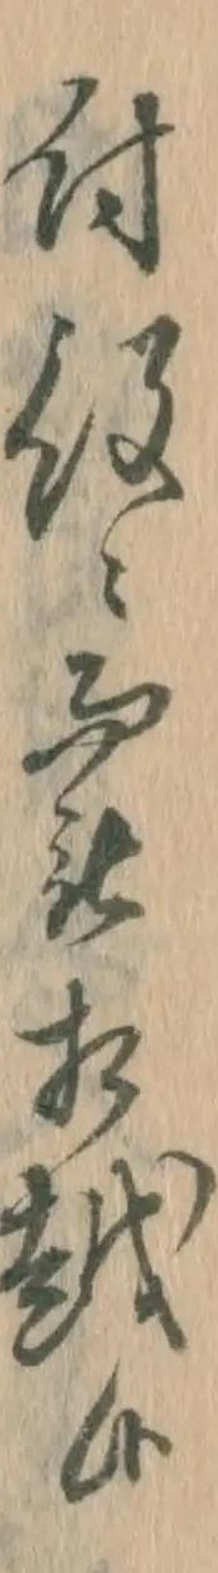付役に而被相越候
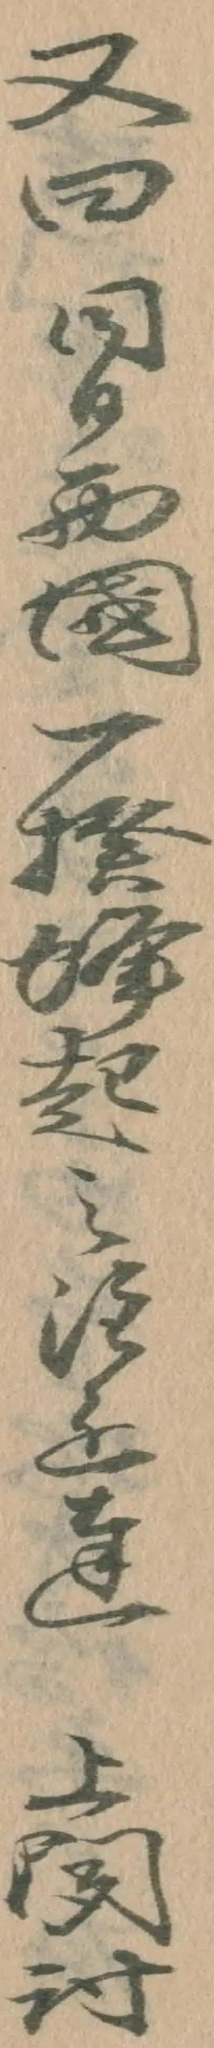又曰同日西国一揆蜂起之注進達上聞討
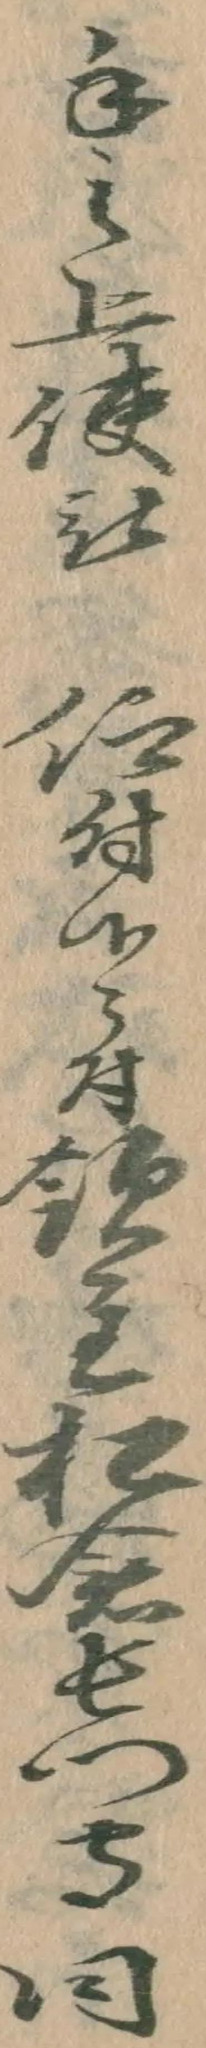手之上使被仰付候に付領主板倉長門守同
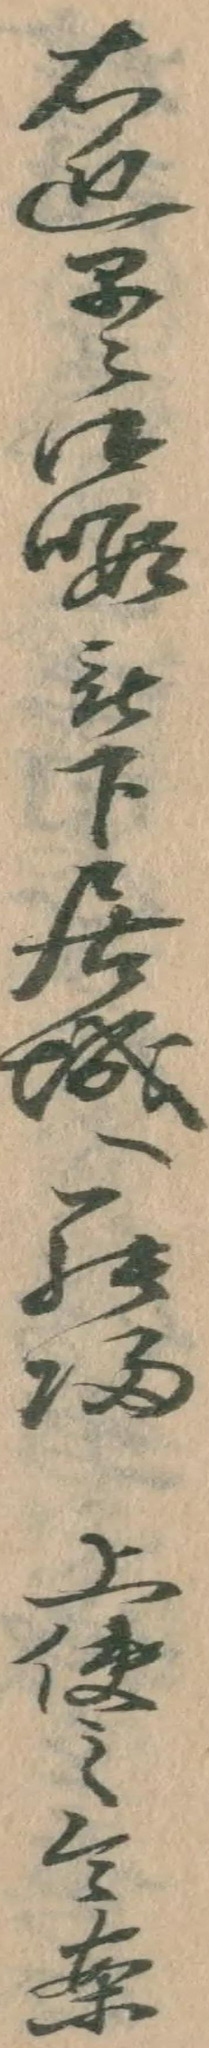右近早々御暇被下居城へ罷帰上使之令案
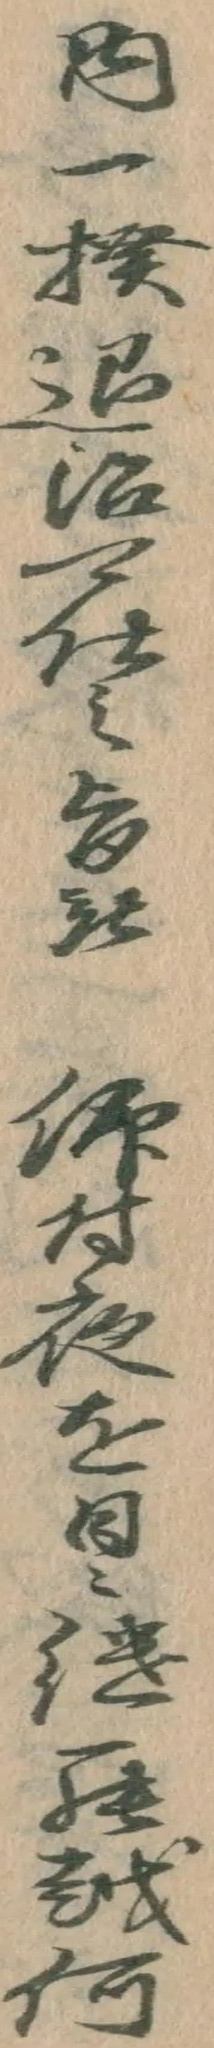内一揆退治可仕之旨被仰付夜を日々鑓罷越何
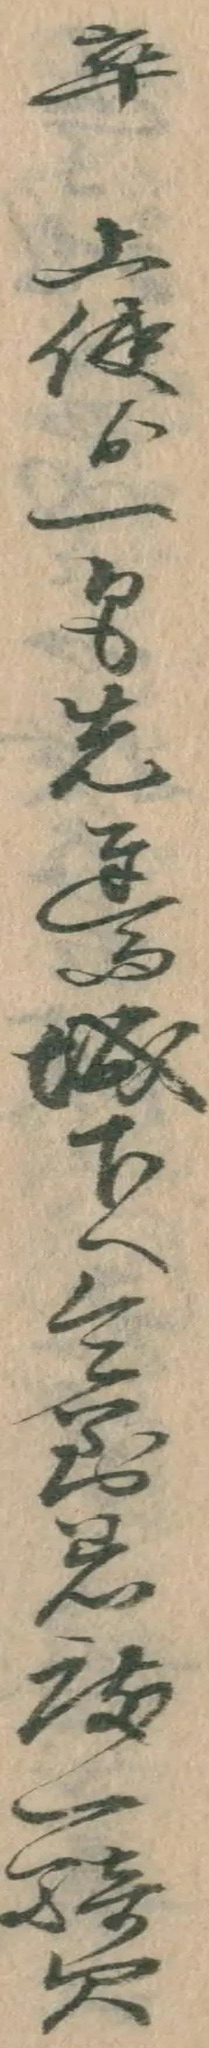卒上使ゟ一日も先達而城下へ令至着度一騎欠
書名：切支丹御退治記 49巻. [2]
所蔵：国立国会図書館 National Diet Library, JAPAN
